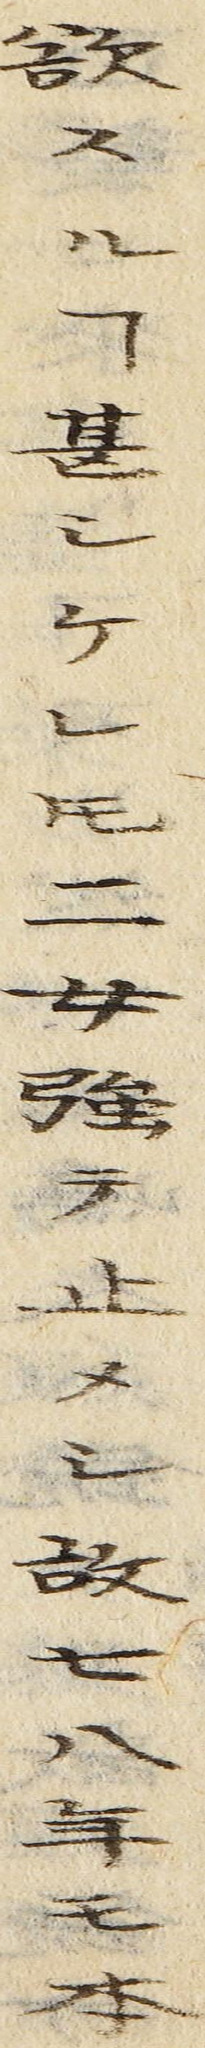欲スルコト甚シケレトモ二女強テ止メシ故七八年モ本
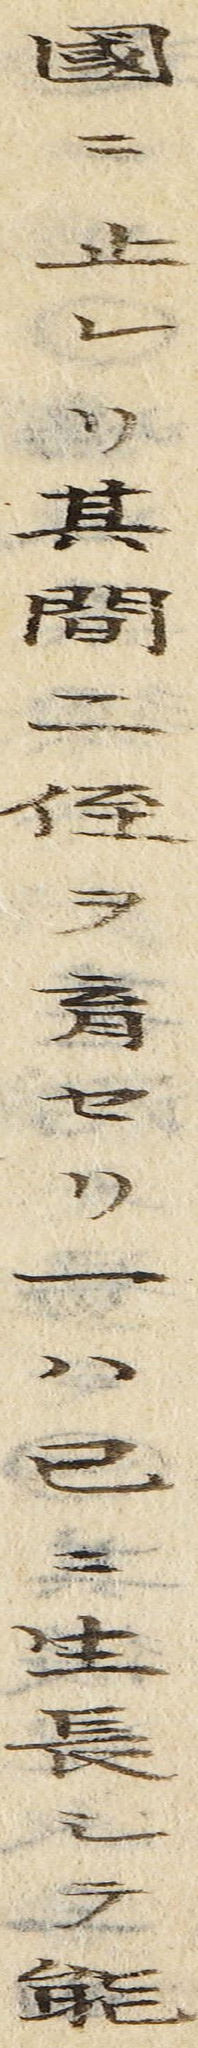国ニ止レリ其間二侄ヲ育セリ一ハ已ニ成長シテ能
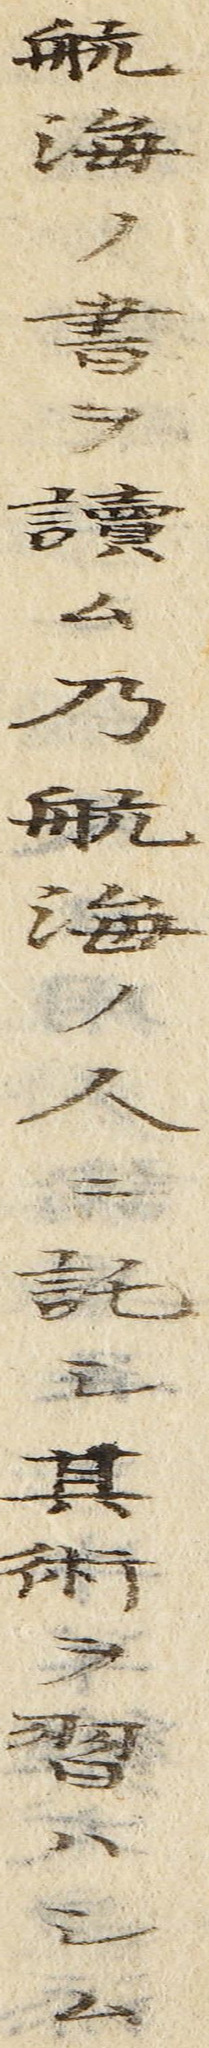航海ノ書ヲ読ム乃航海ノ人ニ託シ其術ヲ習ハシム
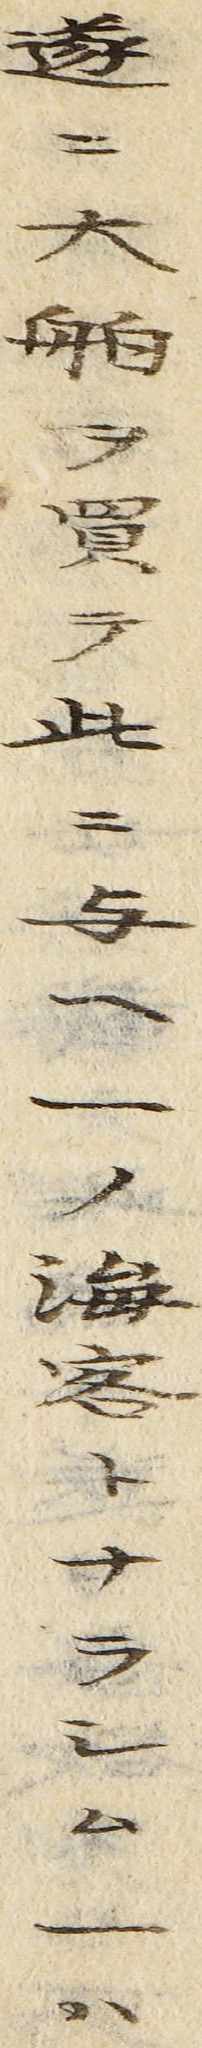遂ニ大舶ヲ買テ此ニ与ヘ一ノ海客トナラシム一ハ
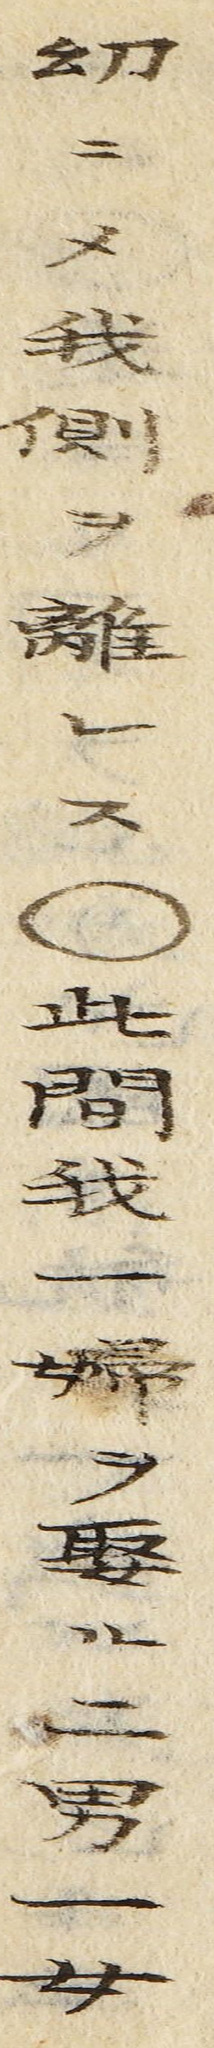幼ニシテ我側ヲ離レス◯此間我一婦ヲ娶ル二男一女
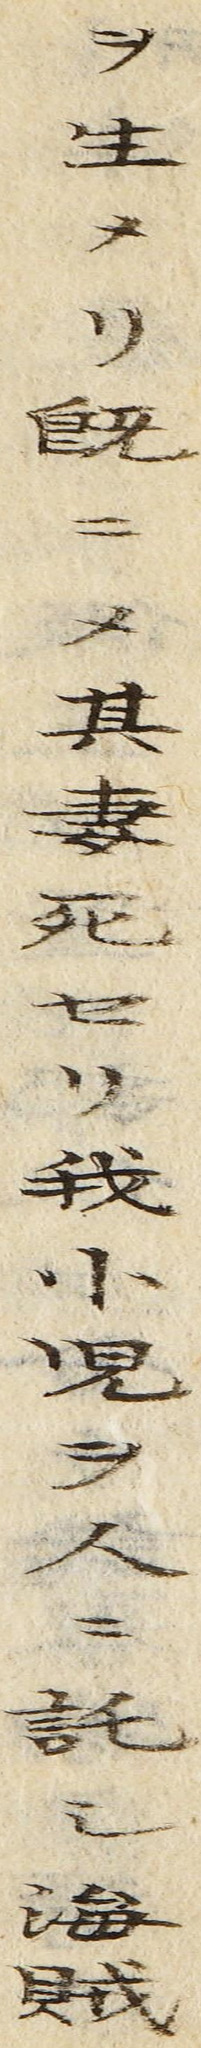ヲ生メリ既ニシテ其妻死セリ我小児ヲ人ニ託シ海賊
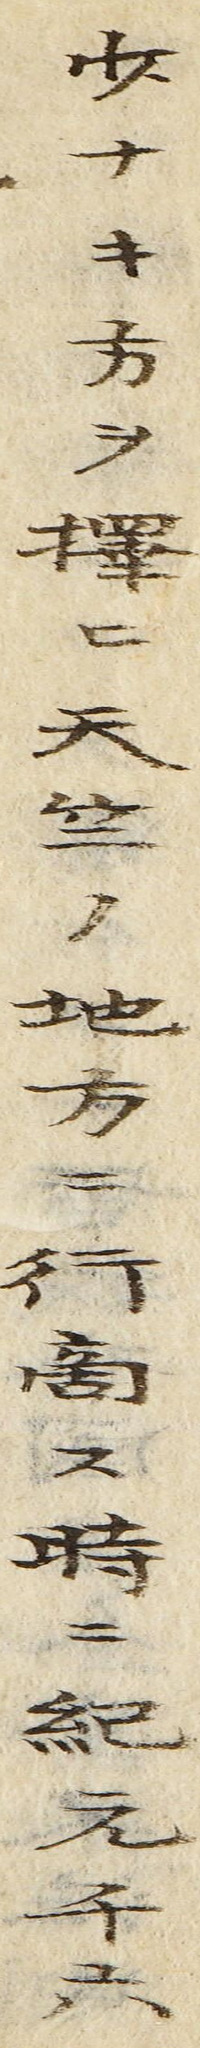少ナキ方ヲ択ヒ天竺ノ地方ニ行商ス時ニ紀元千六
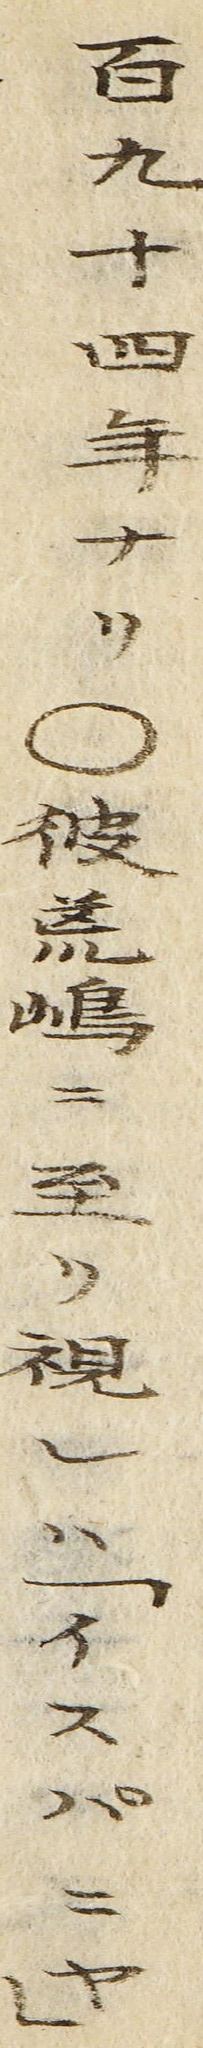百九十四年ナリ◯彼荒嶋ニ至リ視レハ「イスパニヤ」
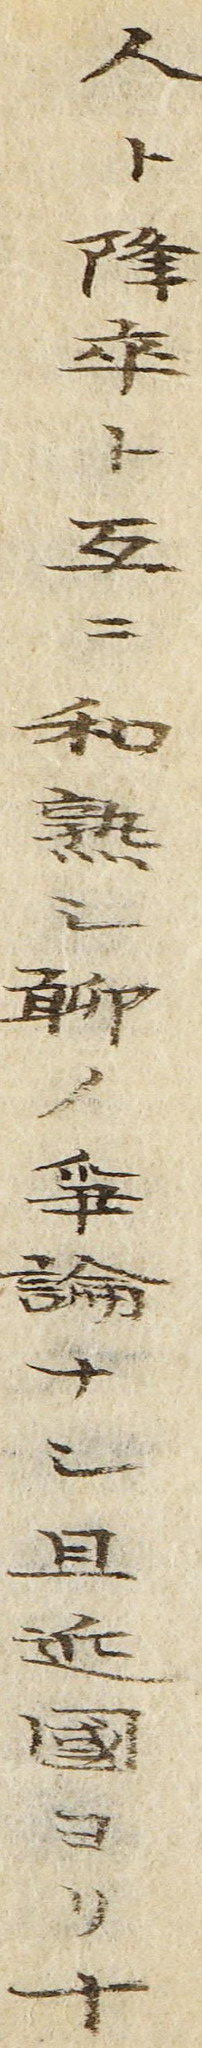人ト降卒ト互ニ和熟シ聊ノ争論ナシ且近国ヨリ十
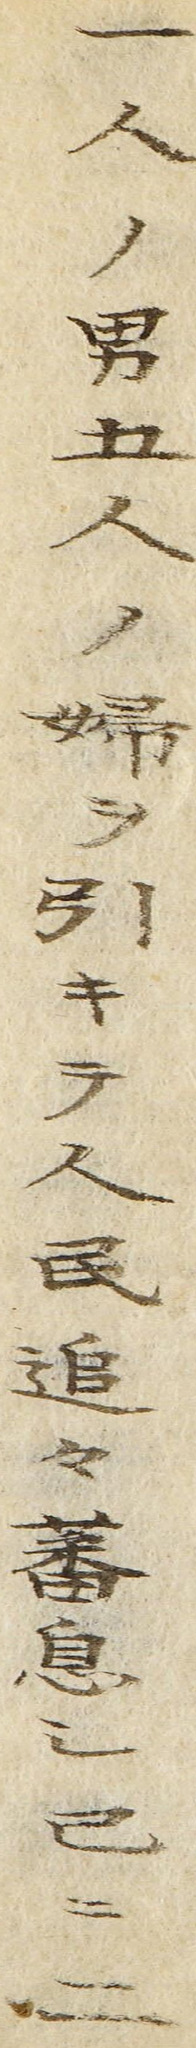一人ノ男五人ノ婦ヲ引キテ人民追々蕃息シ已ニ二

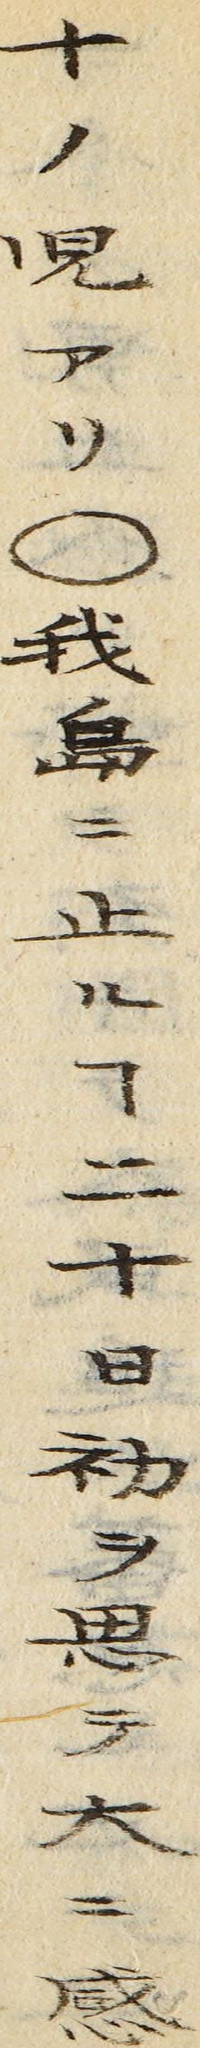十ノ児アリ◯我島ニ止ルコト二十日初ヲ思テ大ニ感
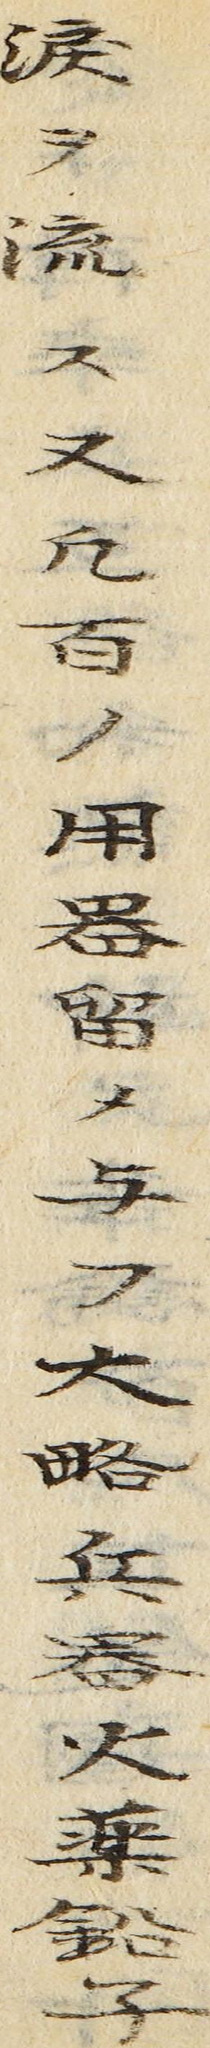涙ヲ流ス又凡百ノ用器留メ与フ大略兵器火薬鉛子
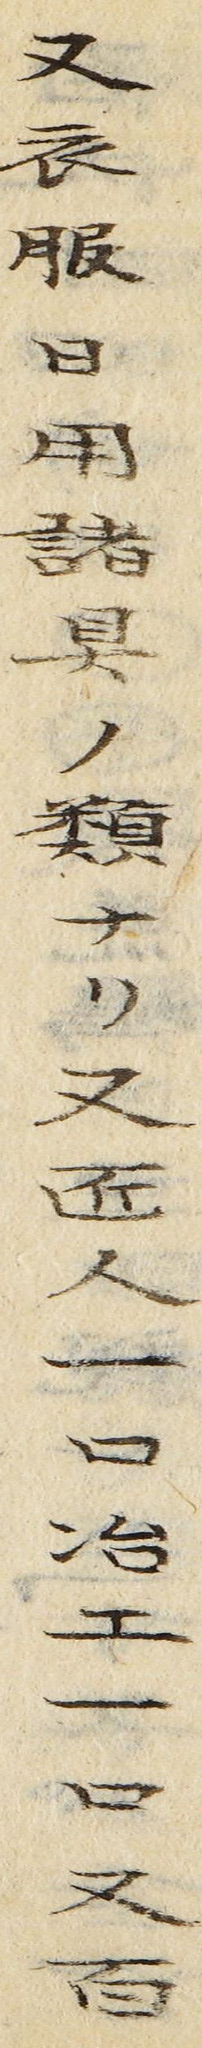又衣服日用諸具ノ類ナリ又匠人一口冶工一口又百
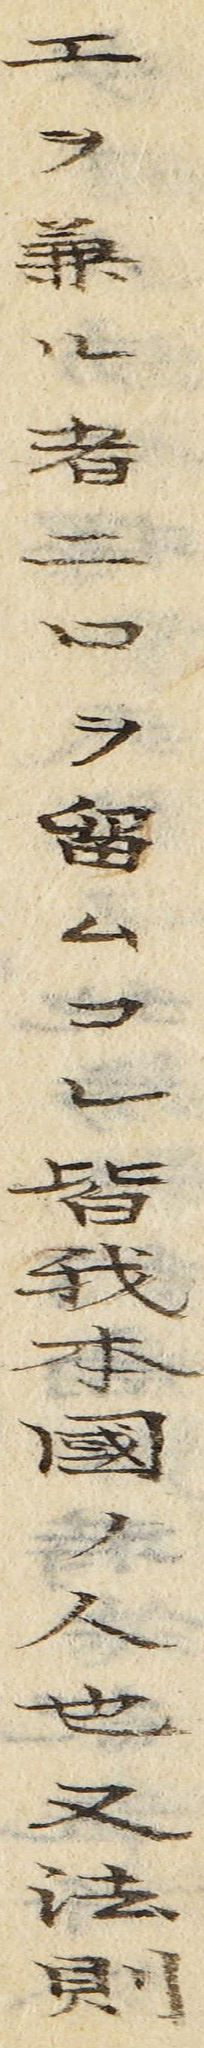工ヲ兼ル者二口ヲ留ムコレ皆我本国ノ人也又法則
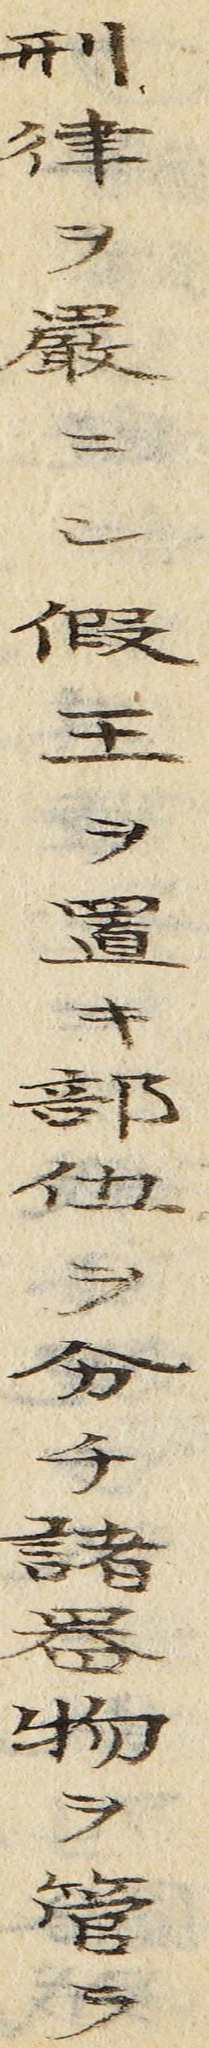刑律ヲ厳ニシ仮王ヲ置キ部伍ヲ分チ諸器物ヲ管ラ
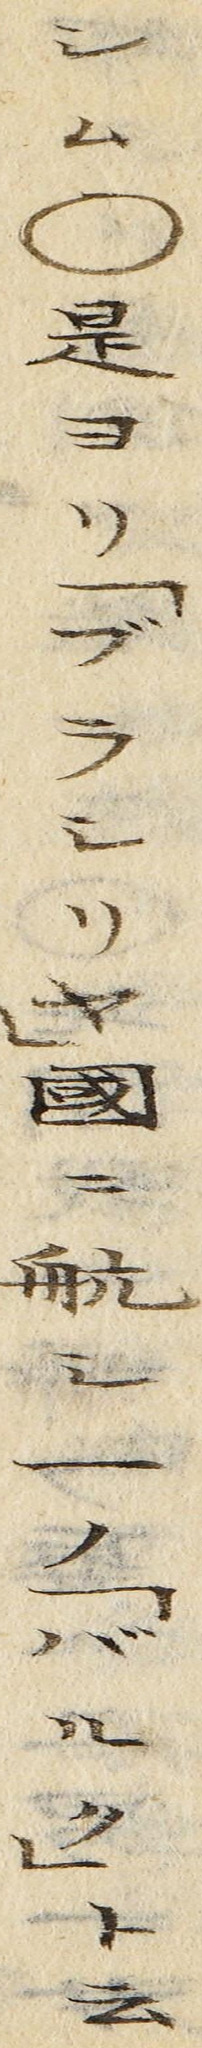シム◯是ヨリ「ブラシリヤ」国ニ航シ一ノ「バルク」ト云
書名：漂流紀事
